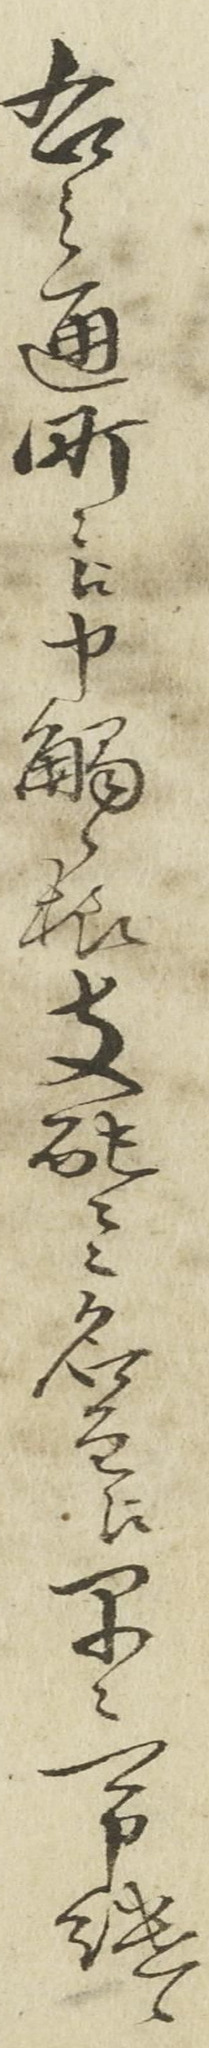右之通町々え申触候様支配〳〵名主え早々可申継候
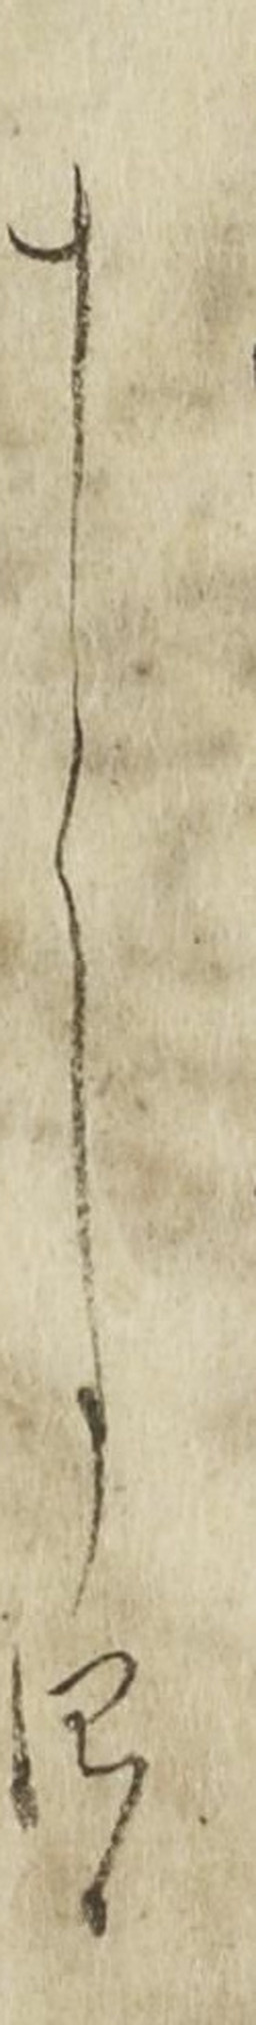十月四日
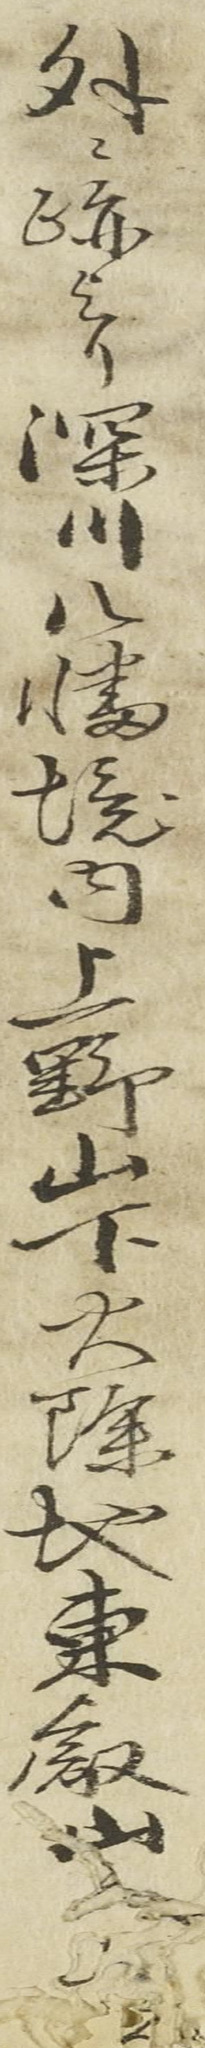外ニ跡より深川八幡境内上野山下火除地東叡山
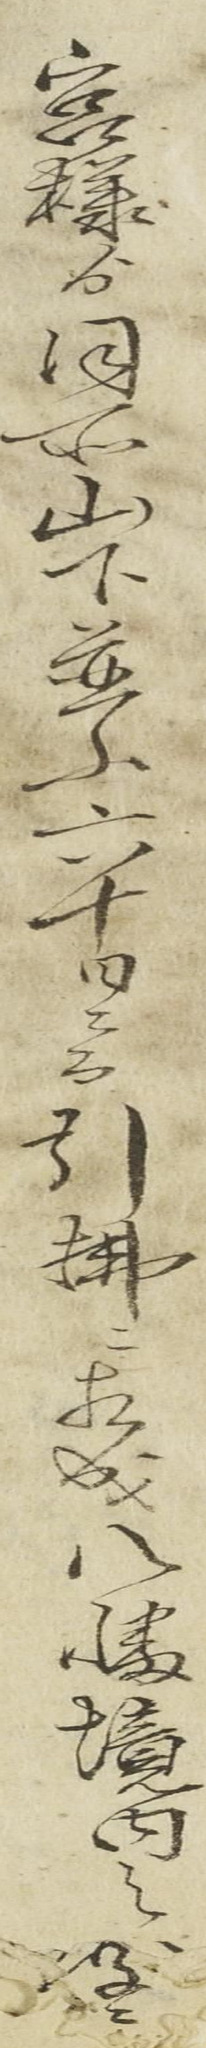宮様ゟ同所山下並ぶ六十日二而引払ニ相成八幡境内之
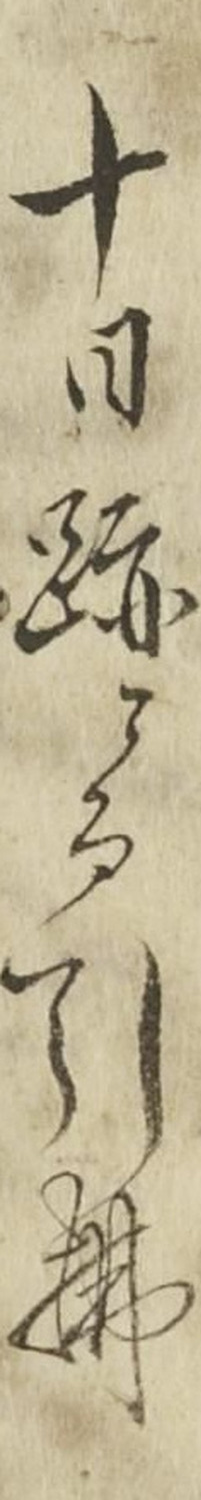十日跡二而引払
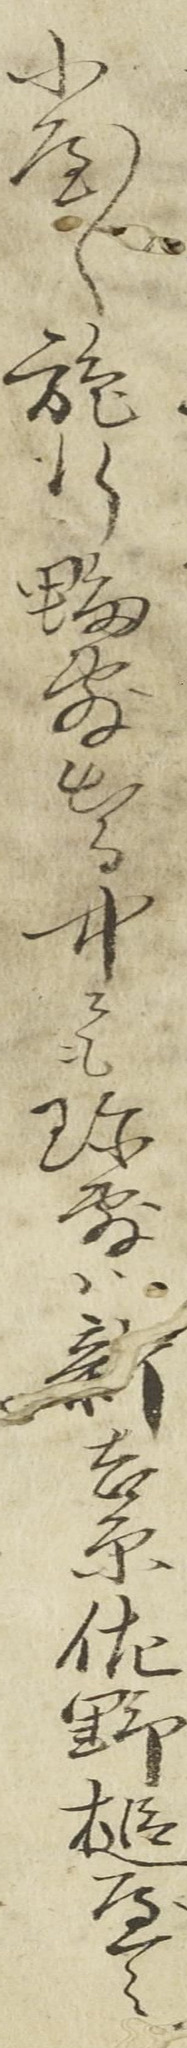小屋〳〵施行夥敷出る中二も珍敷ハ新吉原佐野槌屋之
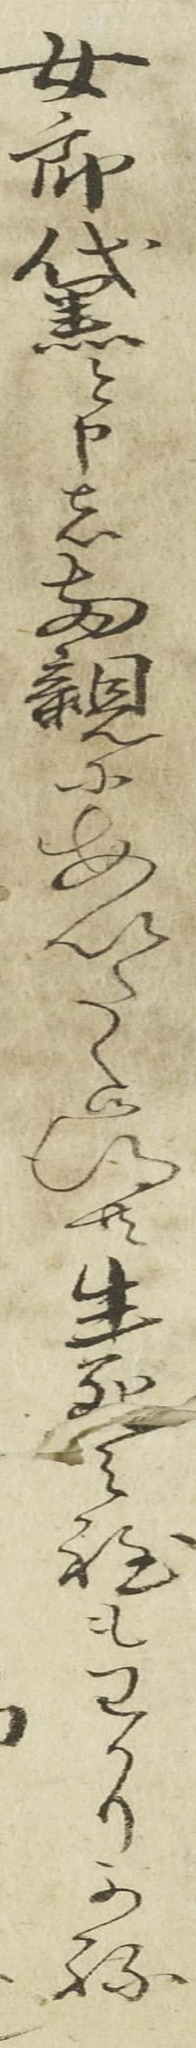女郎黛と申者両親にあいたく候得共生死之程もわかりかね
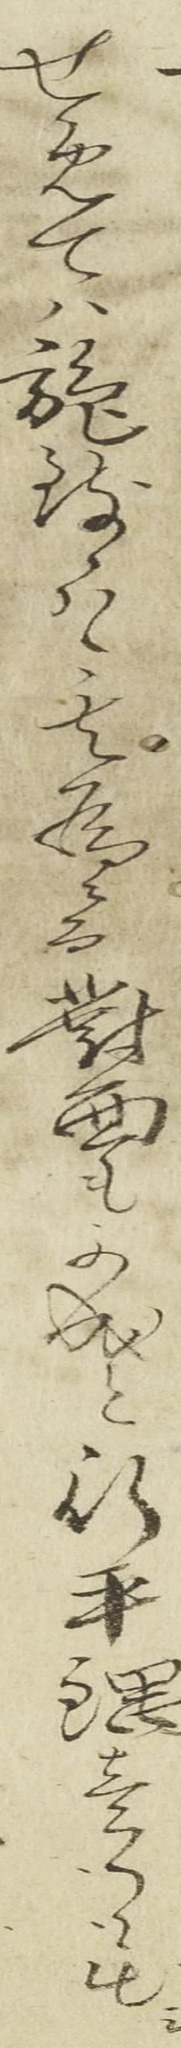せめてハ施致候はゝ其為二而対面も可成と行平鍋壱ツツヽ出シ
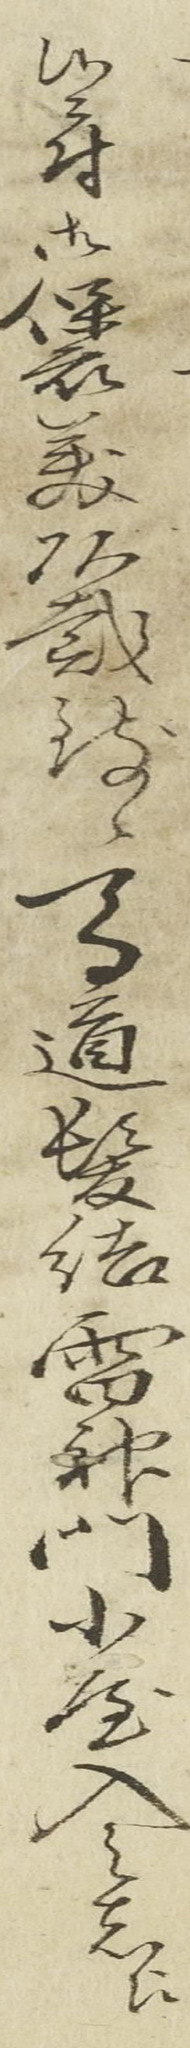候ニ付御褒美頂戴致候馬道髪結雷神門小屋入之者え
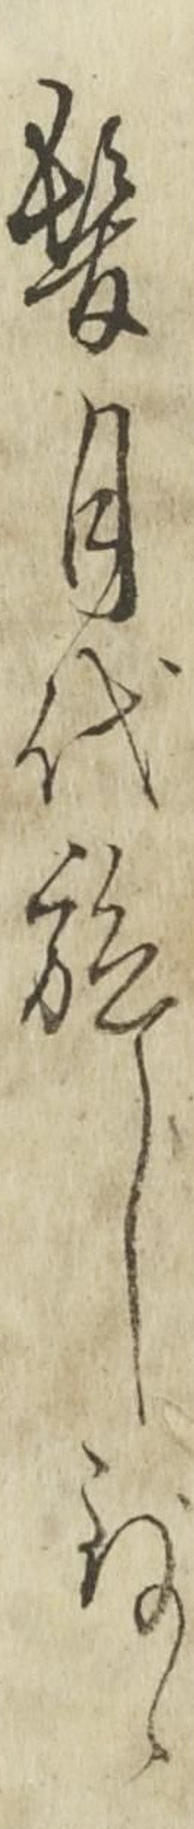髪月代施し致候
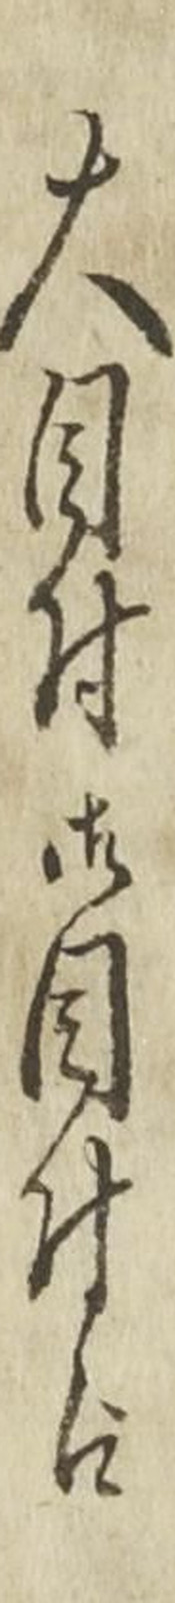大目付御目付え
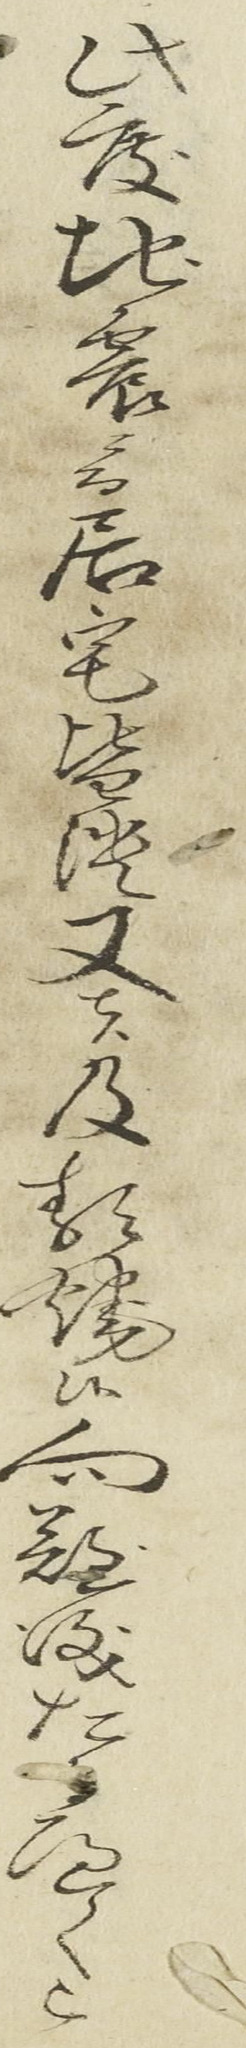此度地震ニ而居宅皆潰又者及類焼候向難儀たるべく被
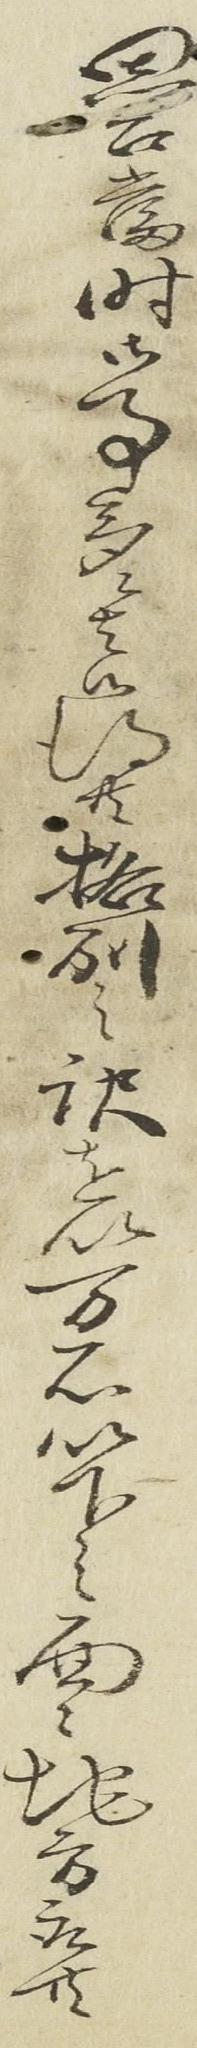思召当時御事多ニは候得共格別之訳を以万石以下之面々地方取共
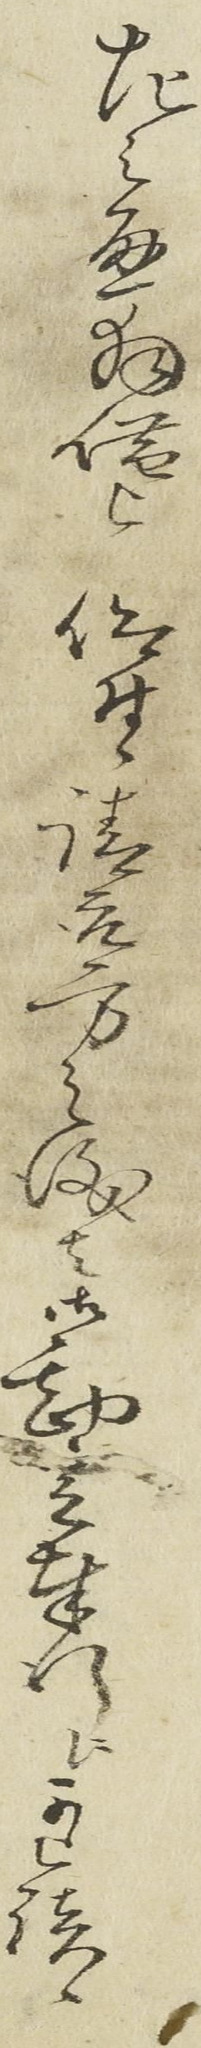左之通拝借被仰付候請取方之儀者御勘定奉行江可被談候
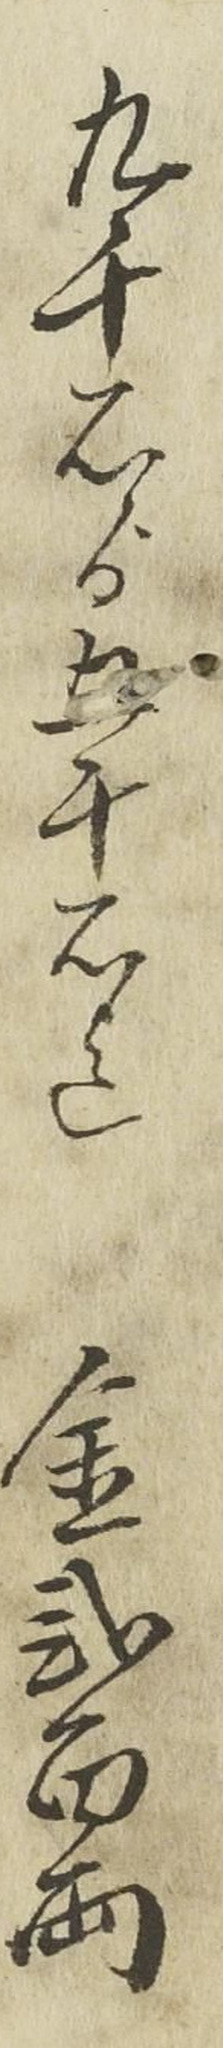九千石ゟ五千石迄金弐百両
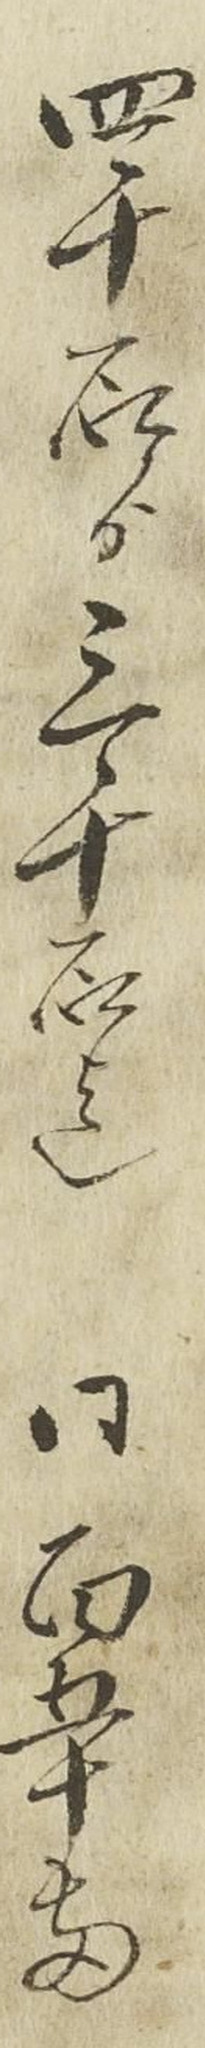四千石ゟ三千石迄同百五十両
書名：安政二乙卯年十月二日大地震之事
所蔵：東京大学地震研究所図書室 Earthquake Research Institute Library, The University of Tokyo, JAPAN
